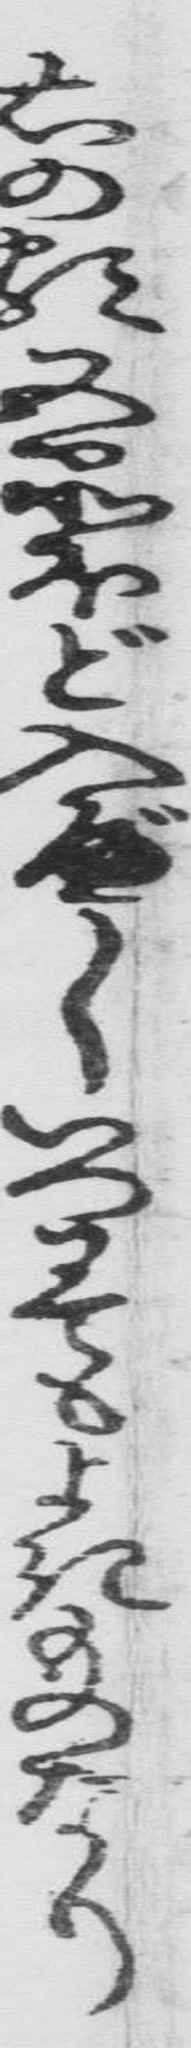右の類五品ほど入べしいつにてもよきものなり
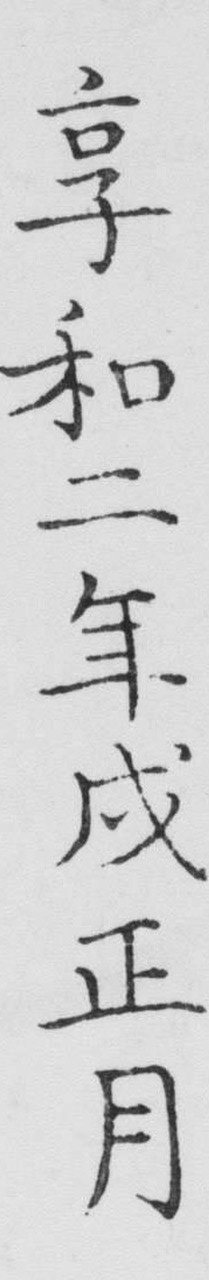享和二年戌正月
